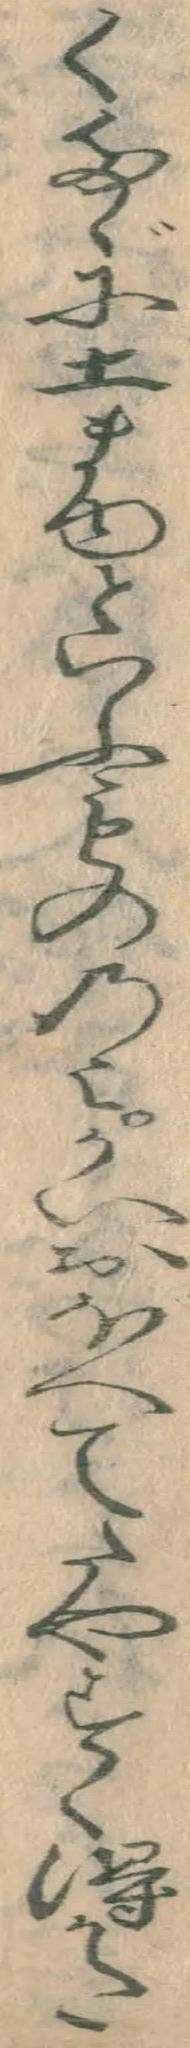くたゞに土まゆといふもの也。かいおほへてたやすく得かた
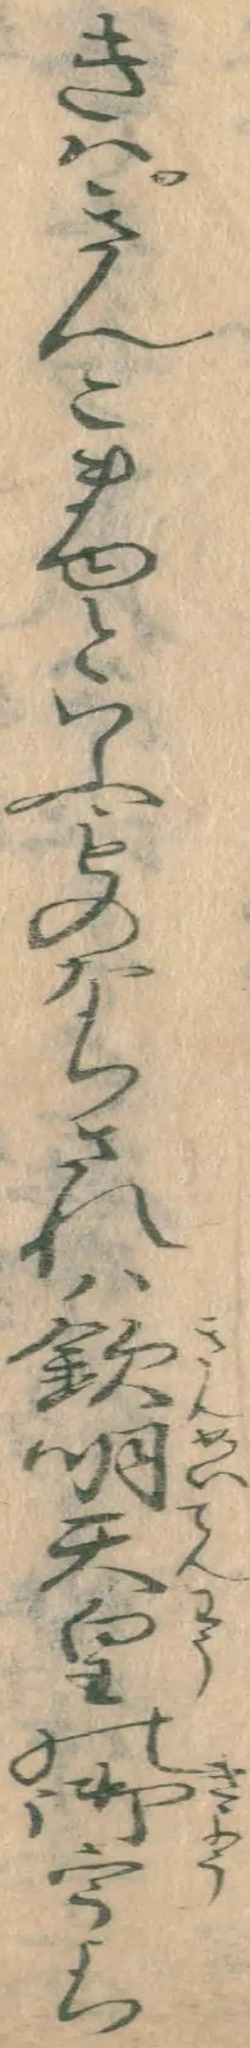きは。きんこまゆといふものならされは欽明天皇の御宇より
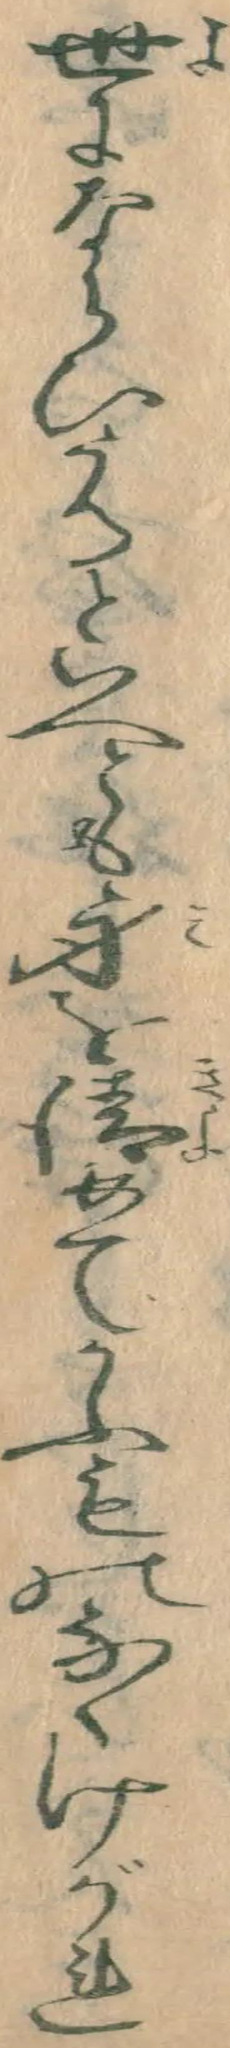世にならひたるといへとも身を清めてかふものなくけがれ

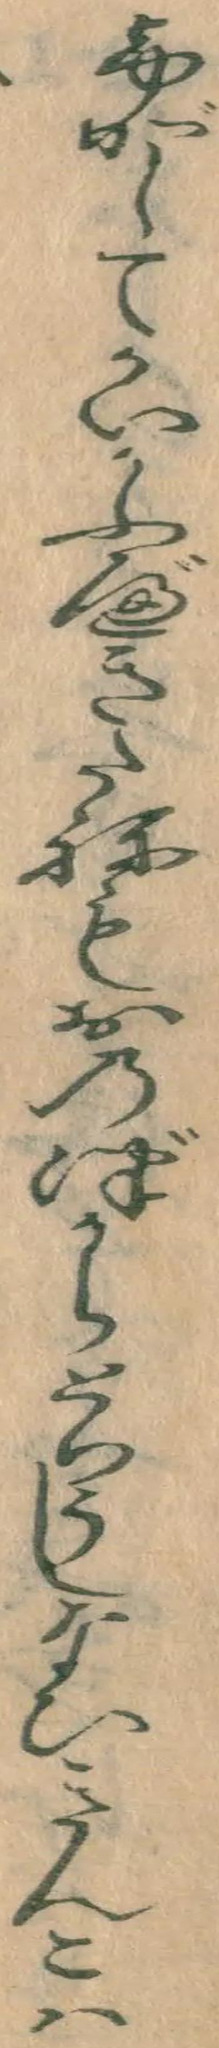けがしてかいかふべきたねもおのづからとりうしなひきんこは
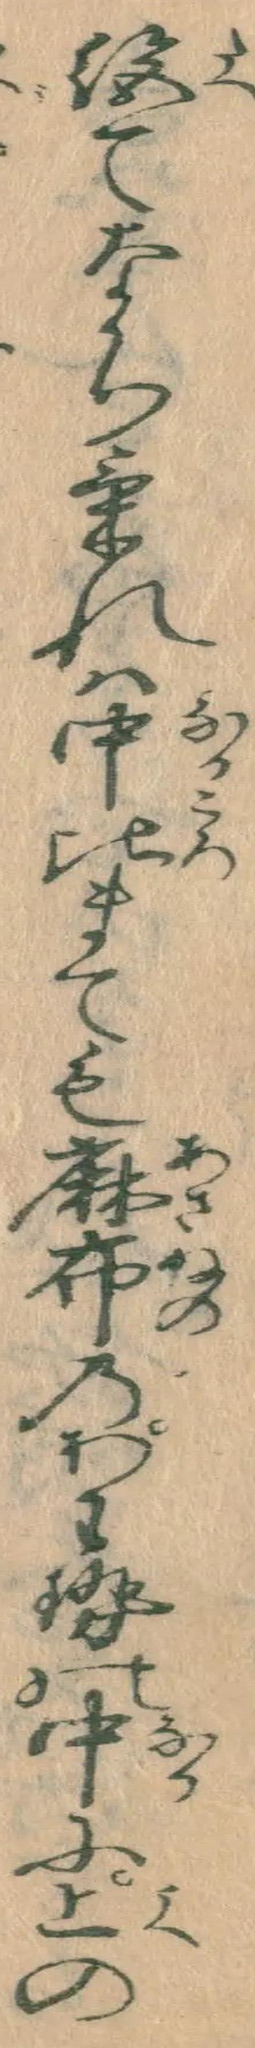絶てなかりけれは中比まても麻布の。あわせの中に。上の
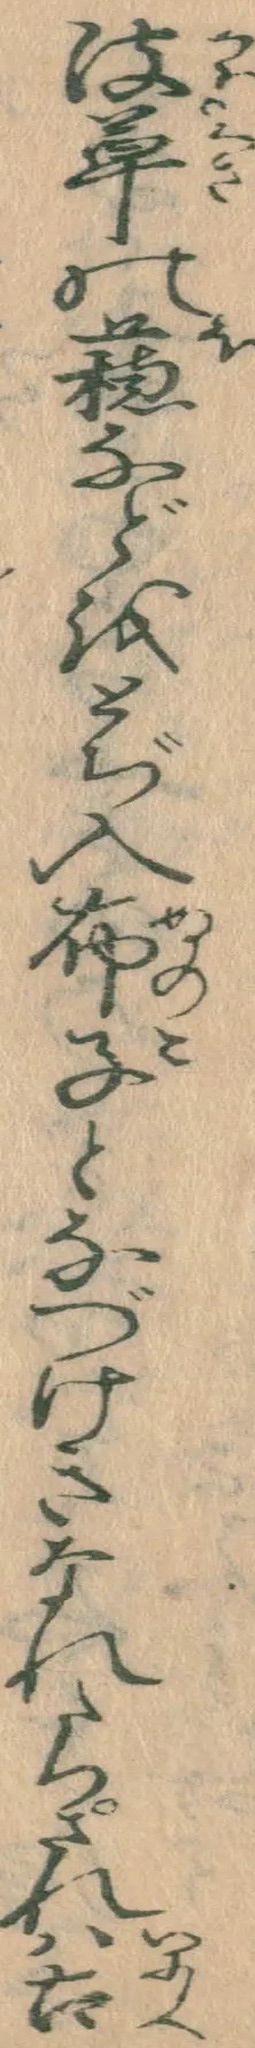皮。草の穂などをとぢ入布子となづけきなれたり。されは古
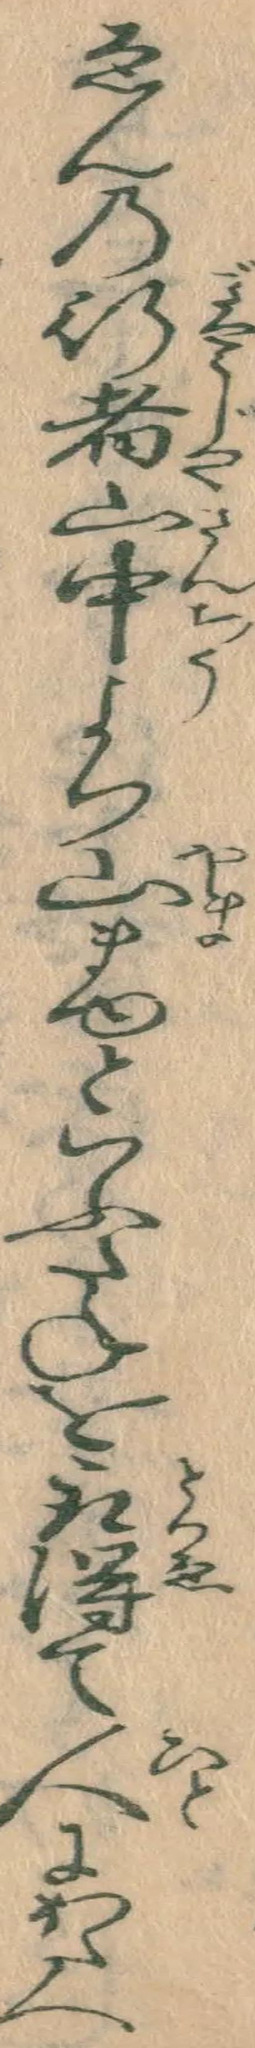ゑんの行者山中より山まゆといふたねを取得て人にあたへ
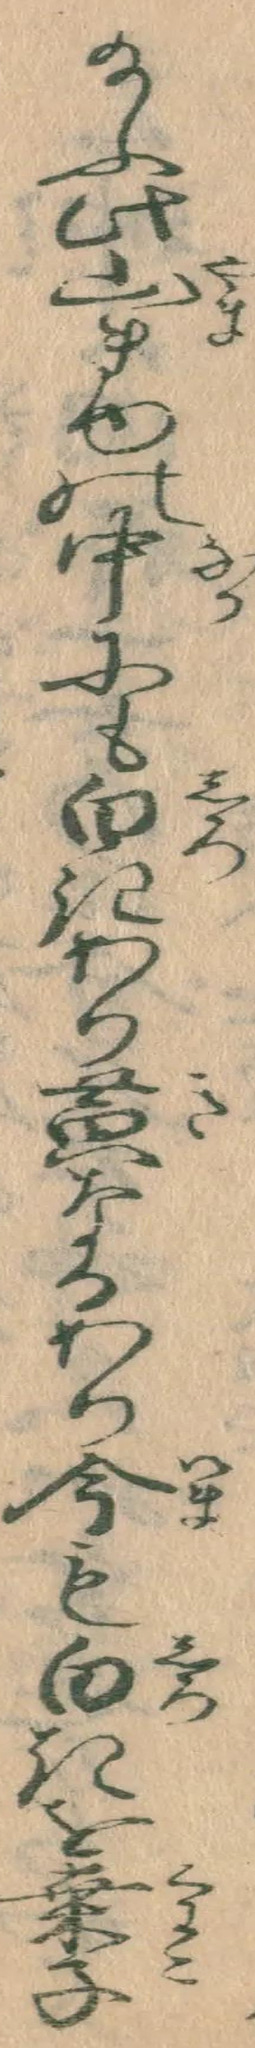給ふ此山まゆの中にも白きあり黄なるあり今も白きを桑子
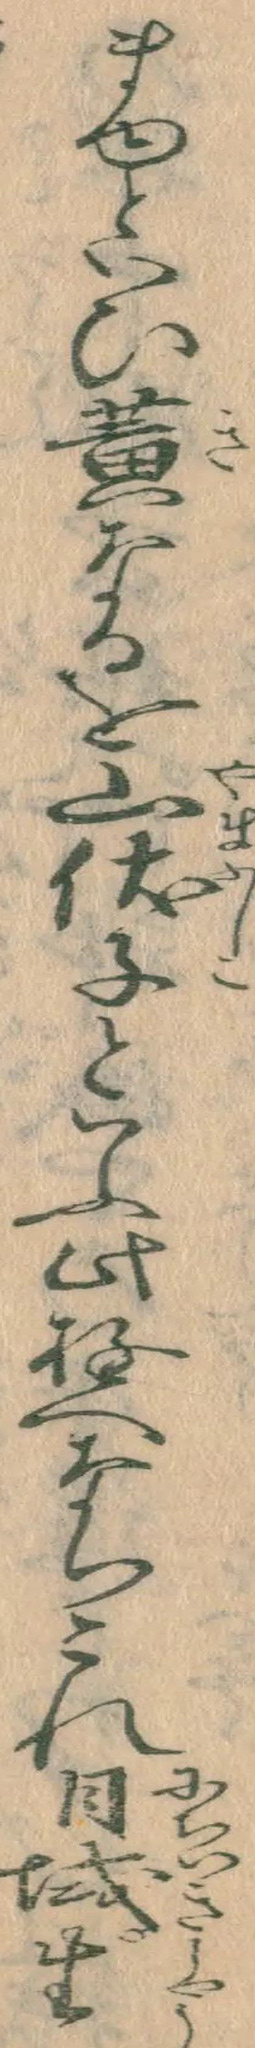まゆといひ黄なるを山伏子といふ此ゆへなりこれ日域。生
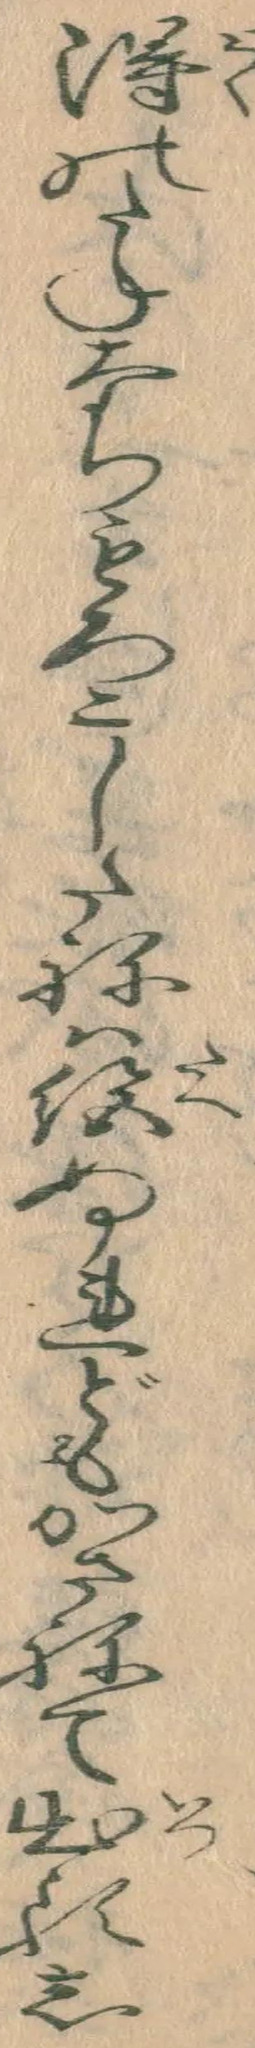得のたねなりもろこしたねは絶ぬれどもかさねて出るし
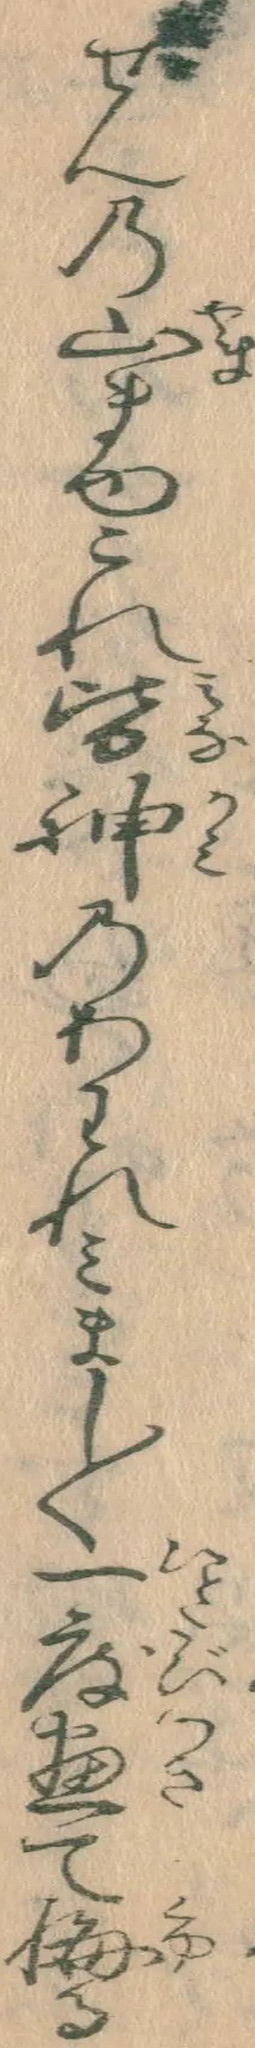せんの山まゆこれ皆神のあわれみまし〳〵一度尽て侮る
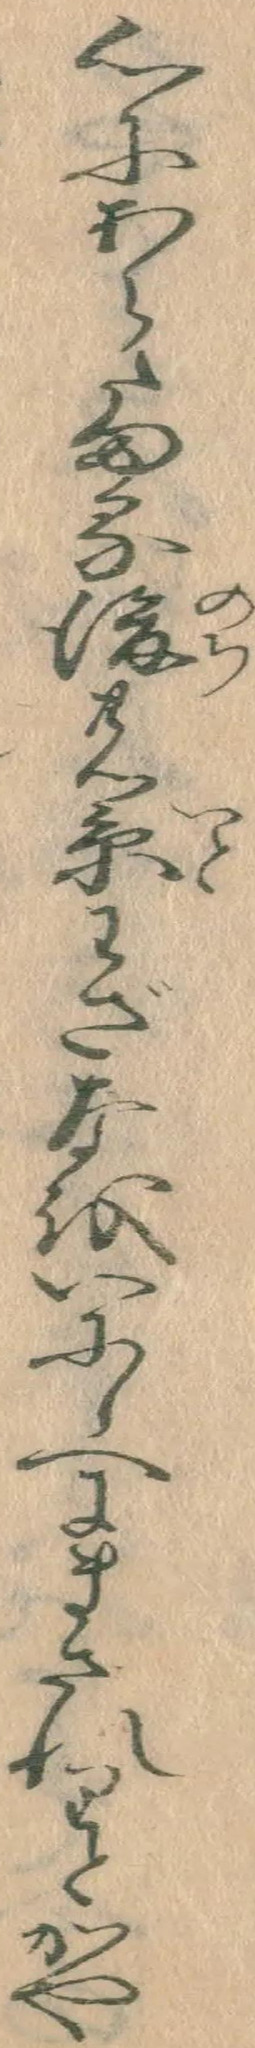心にあらたまる後の糸わざなをいにしへにまされりとかや
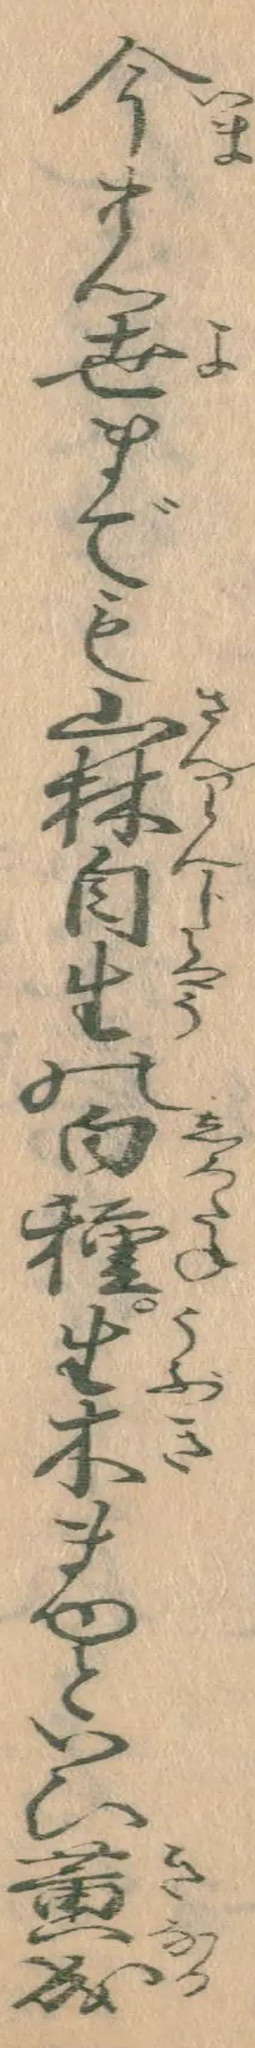今の世までも山林自生の白種。生木まゆといひ黄成
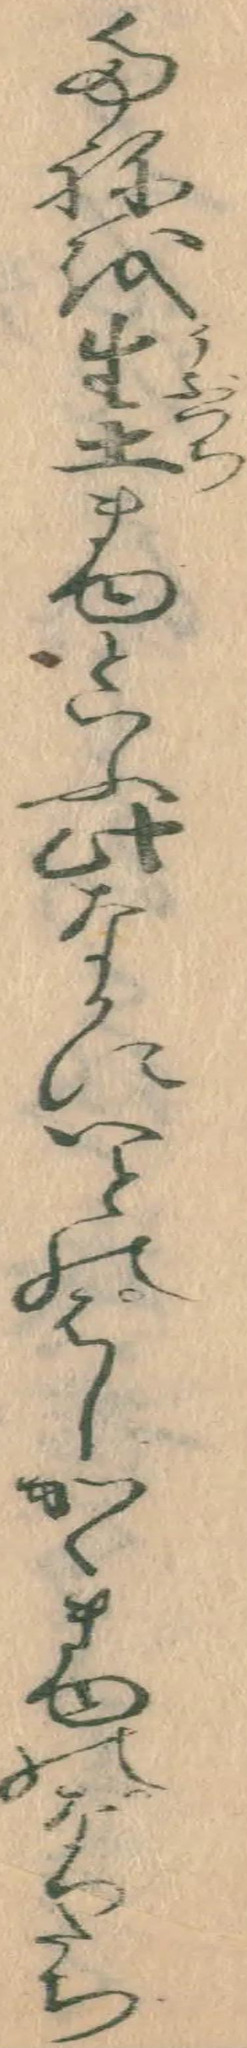たねを生土まゆといふ此なかにいとの。はしかくまゆの。なりたち
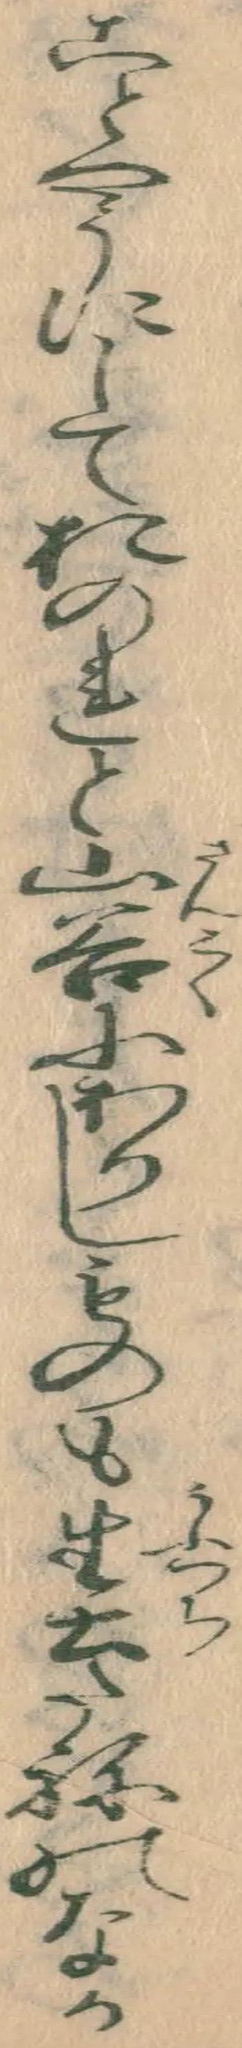ことやうにしておのれと山谷にありしものも生土たねのなか
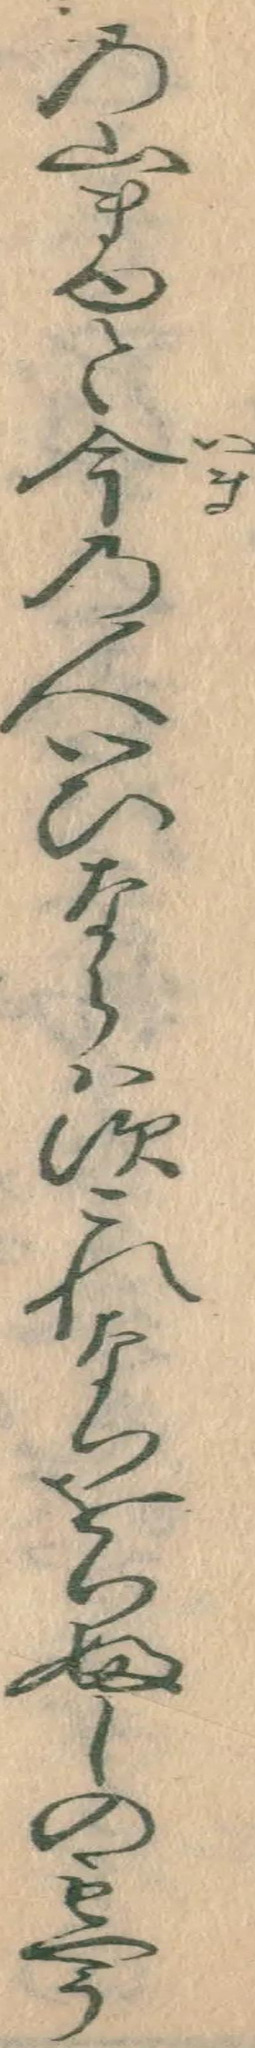の山まゆと今の人いひならはすこれなりをりふしのもやう
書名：蚕飼養法記
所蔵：国立国会図書館 National Diet Library, JAPAN
